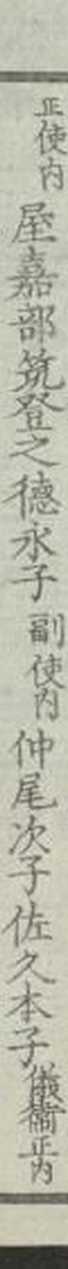正使内屋嘉部筑登之徳永子副使内仲尾次子佐久本子儀衛正内
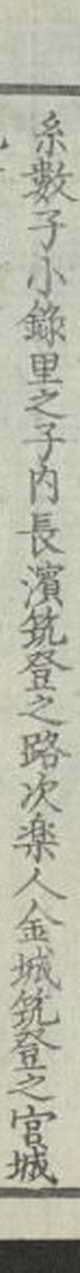糸数子小録里之子内長濱筑登之路次楽人金城筑登之宮城
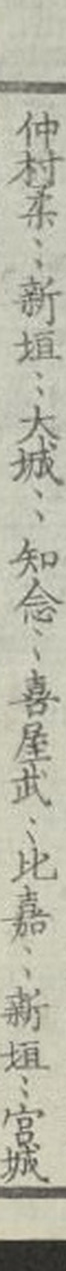仲村柔・・新垣・・大城・・知念・・喜屋武・・比嘉・・新垣・・宮城
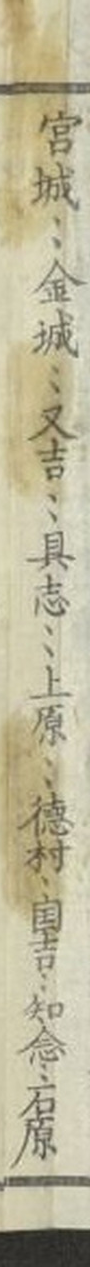宮城・・金城・・又吉・・具志・・上原・・徳村・・国吉・・知念・・石原
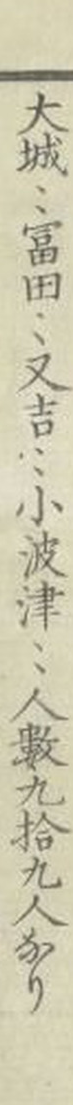大城・・冨田・・又吉・・小波津・・人数九拾九人なり
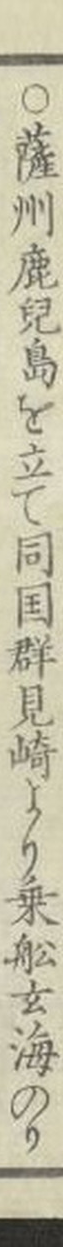○薩州鹿児島を立て同国群見崎より乗船玄海のり
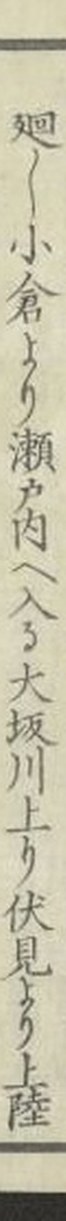廻し小倉より瀬戸内へ入る大坂川上り伏見より上陸
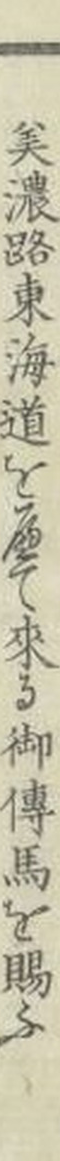美濃路東海道をへて来る御伝馬を賜ふ

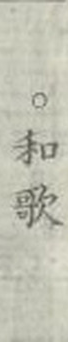○和歌
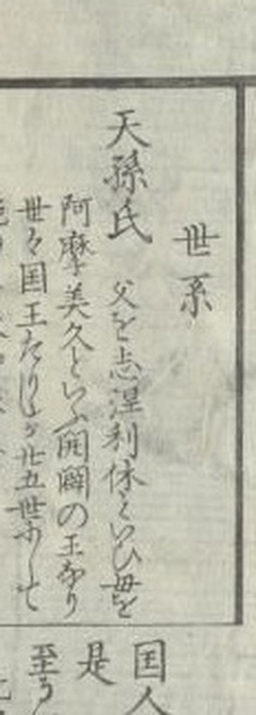天孫氏父を志涅利休といひ母を
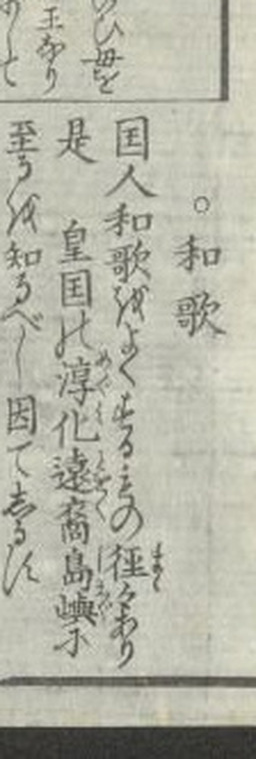国人和歌をよくすることの径々あり
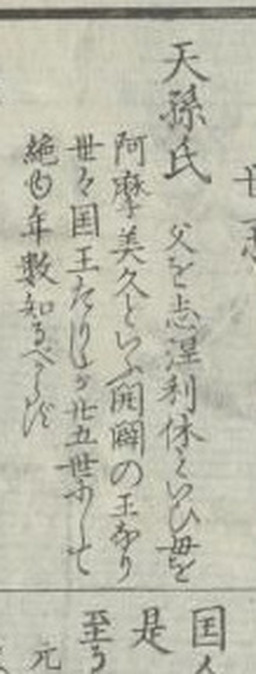阿摩美久といふ開闢の王なり
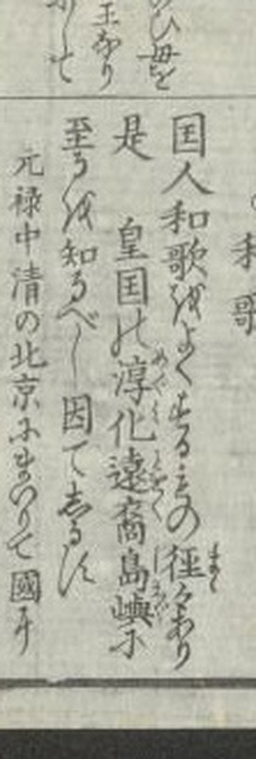是皇国の淳化遠裔島嶼に
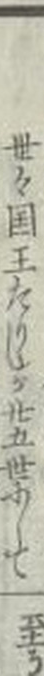世々国王たりしが卄五世にして
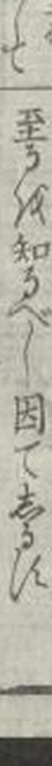至るを知るべし因てしるす
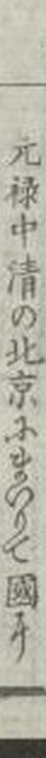元禄中清の北京にまいりて国に
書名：中山国使略
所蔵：University of the Ryukyus Library
